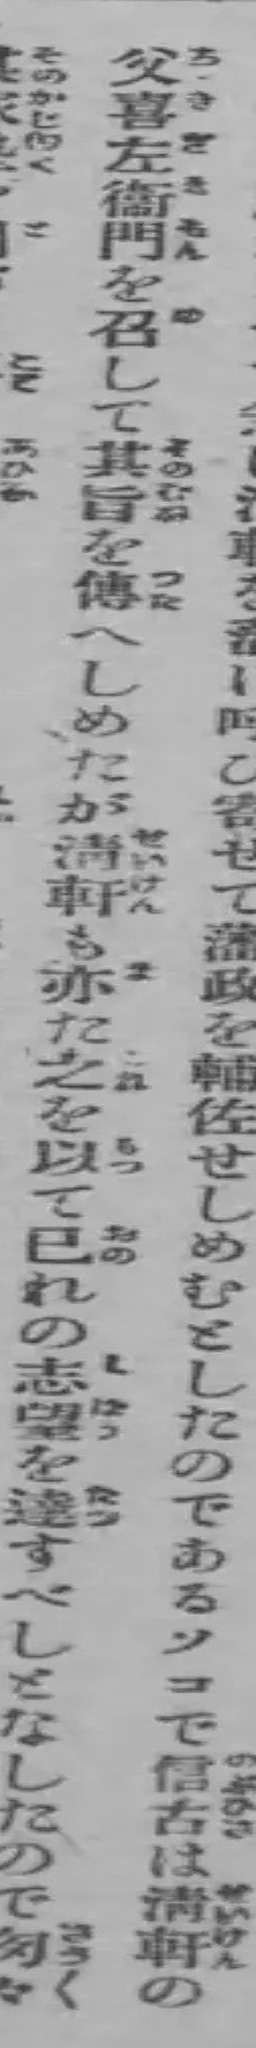父喜左衛門を召して其旨を伝へしめたが清軒も亦た之を以て己れの志望を達すべしとなしたので匆々
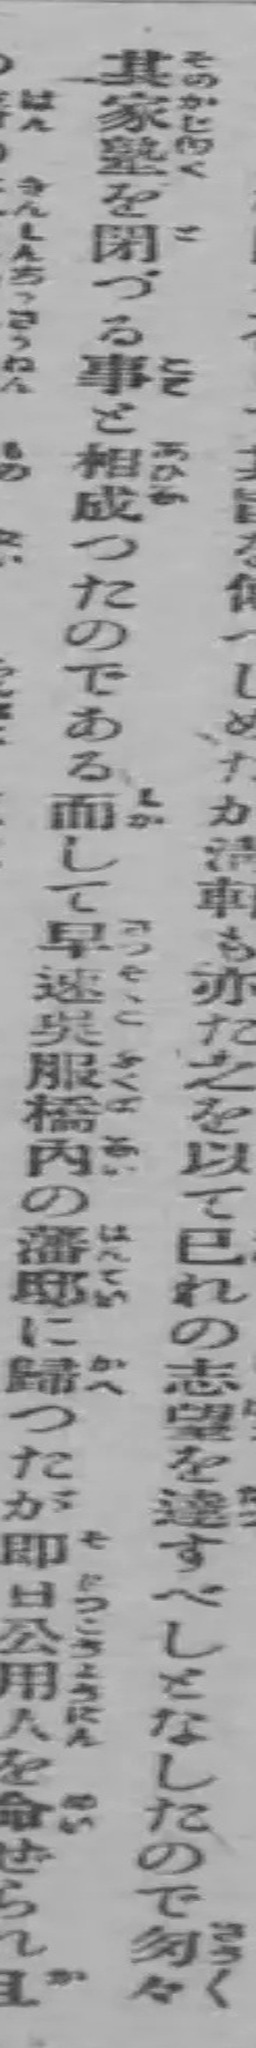清軒の帰藩其家塾を閉づる事と相成つたのである而して早速呉服橋内の藩邸に帰つたが即日公用人を命ぜられ且
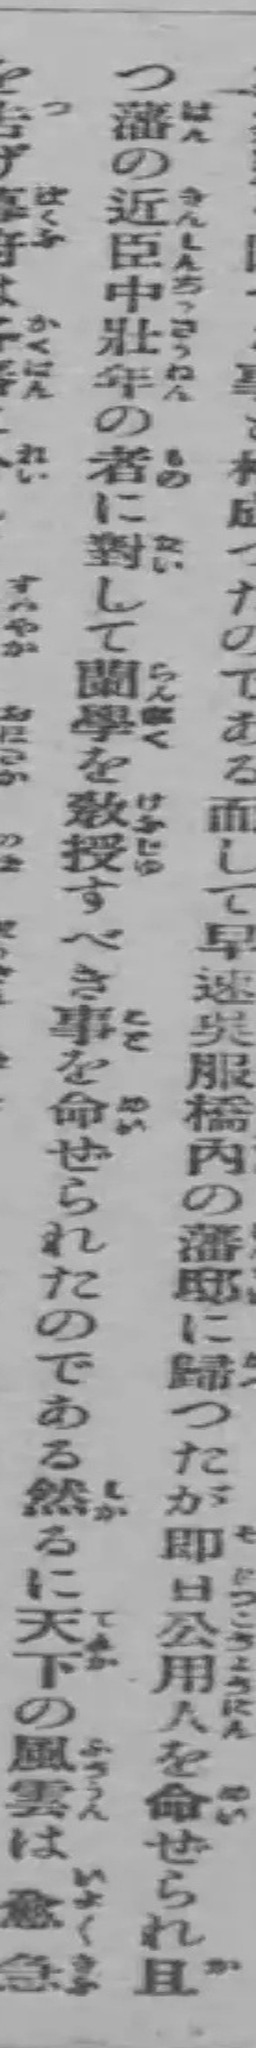つ藩の近臣中壮年の者に対して蘭学を教授すべき事命ぜられたのである然るに天下の風雲は愈急
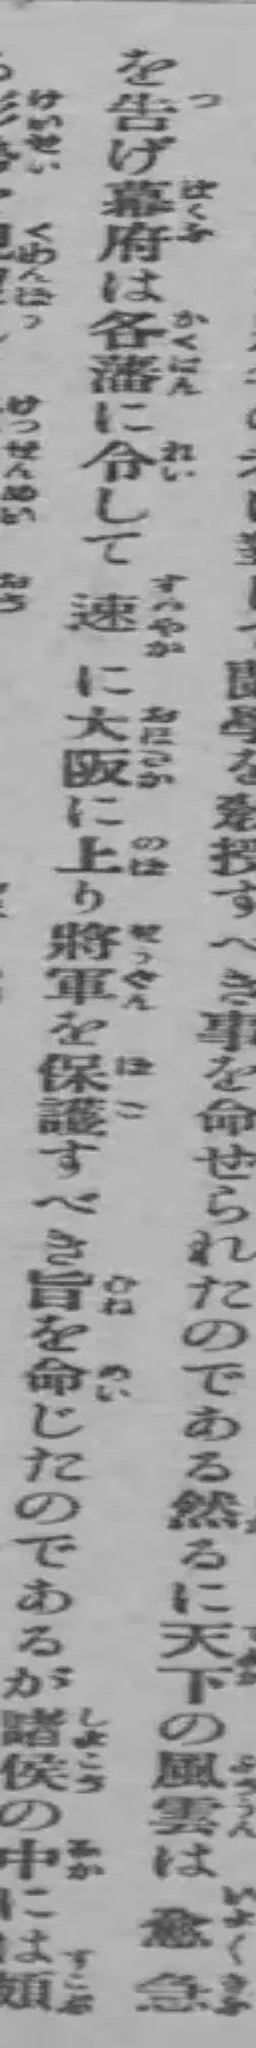を告げ幕府は各藩に令して速に大阪に上り将軍を保護すべき旨を命じたのであるが諸侯の中には頗
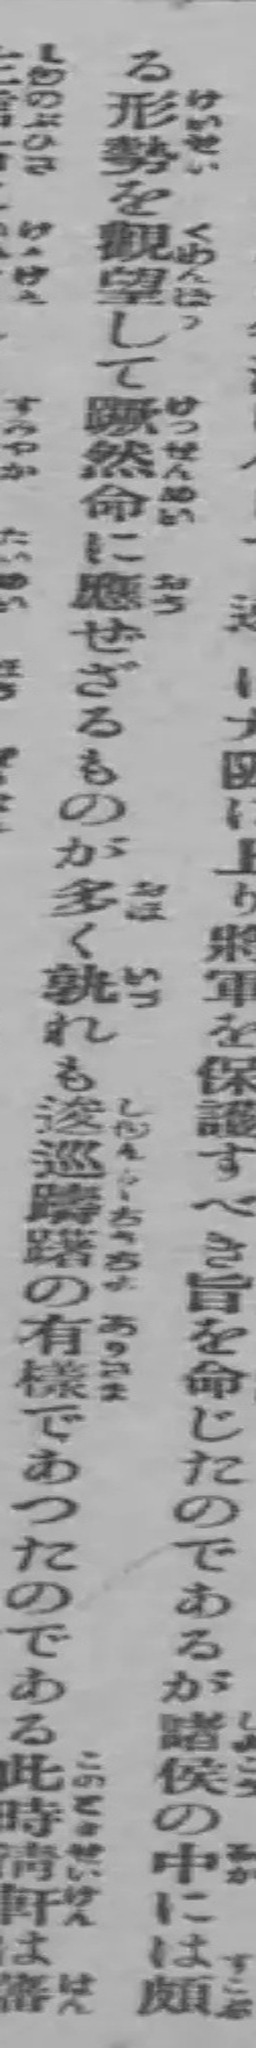る形勢を観望して蹶然命に応ぜざるものが多く孰れも逡巡躊躇の有様であつたのである此時清軒は藩
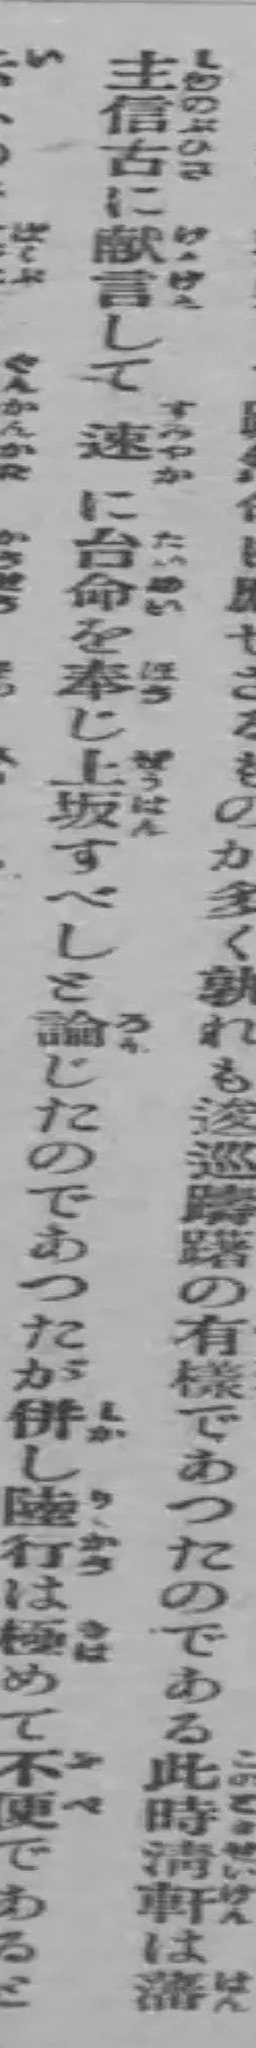主信古に献言して速に台命を奉じ上坂すべしと論じたのであつたが倂し陸行は極めて不便であると
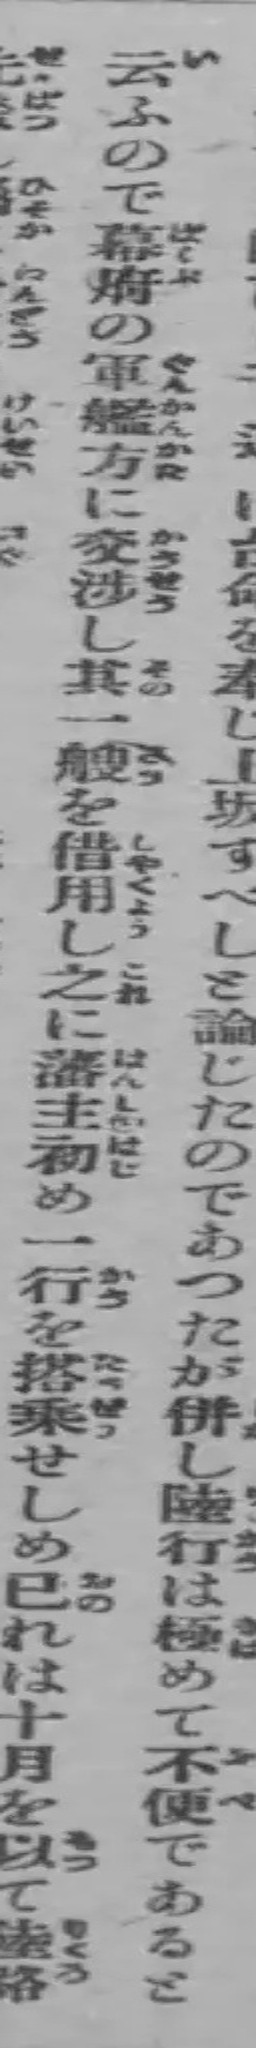云ふので幕府の軍艦方に交渉し其一艘を借用し之に藩主初め一行を搭乗せしめ巳れは十月を以て陸路
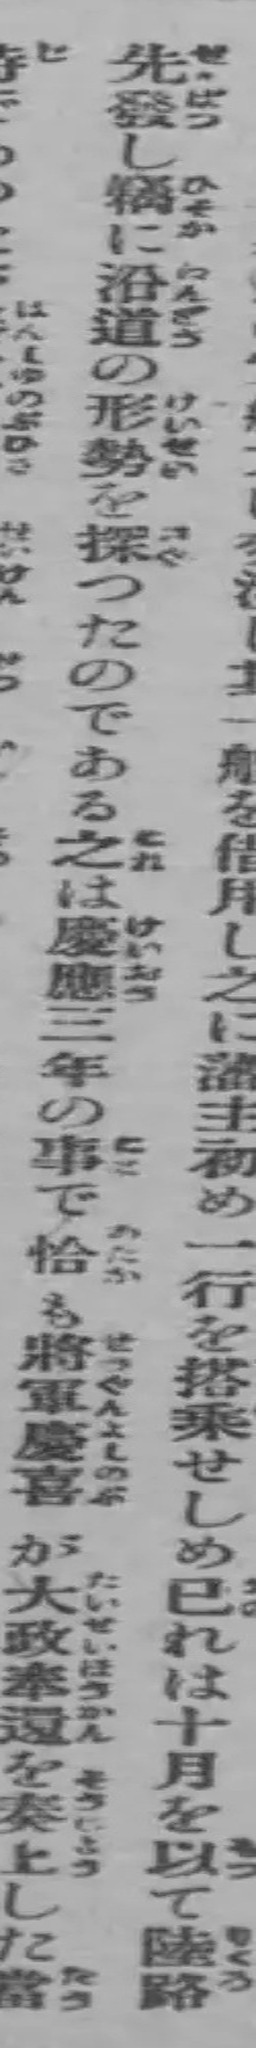信古の下阪先発し竊に沿道の形勢を探つたのである之は慶応三年の事で恰も将軍慶喜が大政奉還を奏上した当
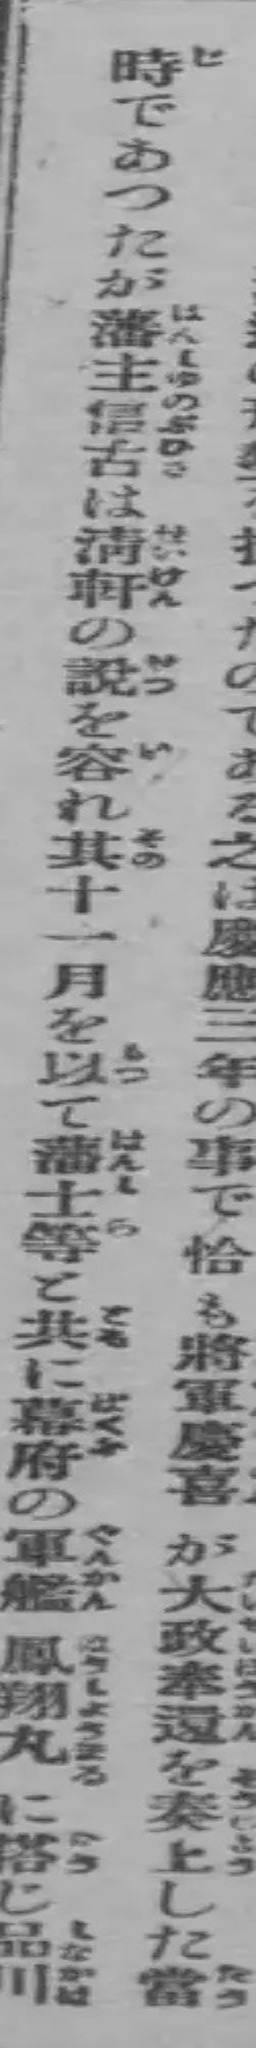時であつたが藩主信古は清軒の説を容れ其十一月を以て藩士等と共に幕府の軍艦鳳翔丸に搭じ品川
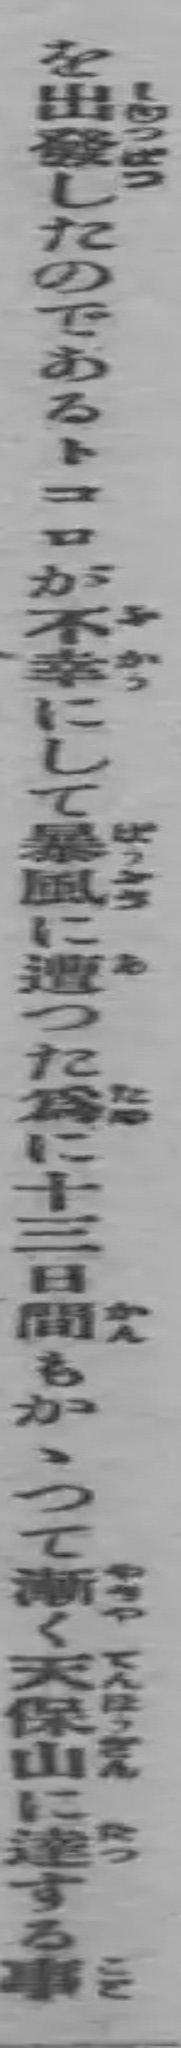を出発したのであるトコロが不幸にして暴風に遭つた為に十三日間もかゝつて漸く天保山に達する事
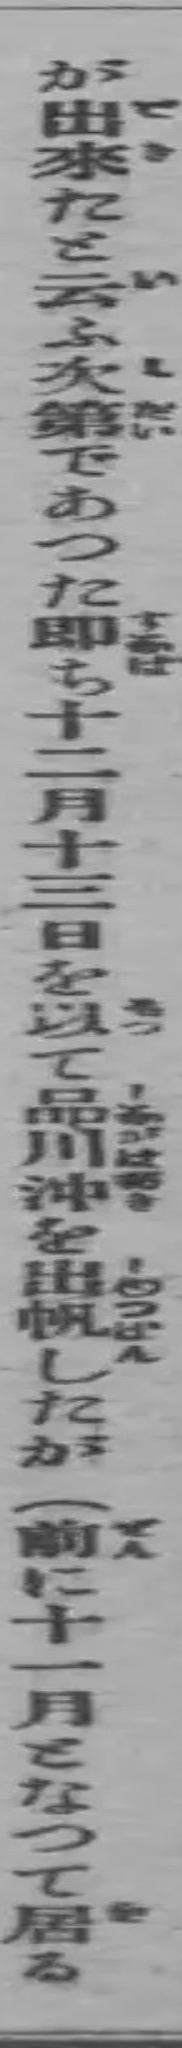が出来たと云ふ次第であつた即ち十二月十三日を以て品川沖を出帆したが(前に十一月となつて居る
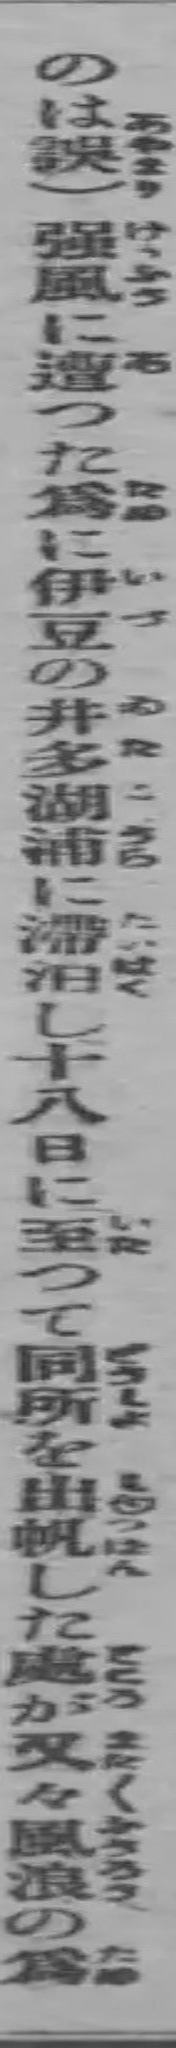のは誤)強風に遭つた為に伊豆の井多湖浦に滞泊し十八日に至つて同所を出帆した処が又々風浪の為
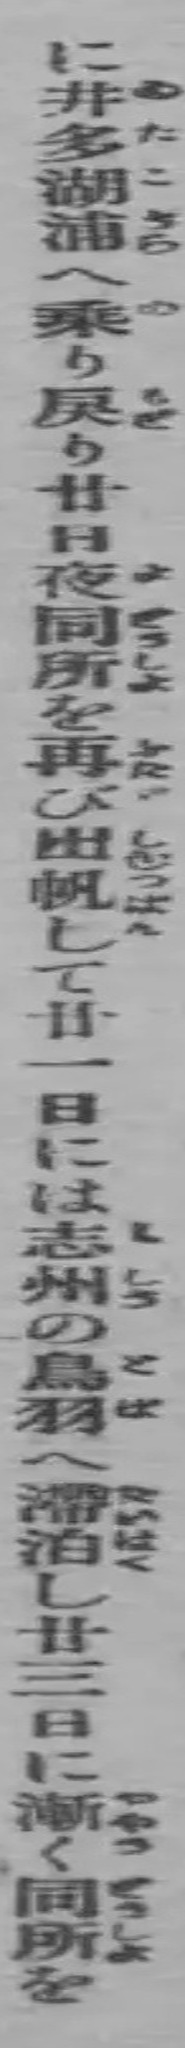に井多湖浦へ乗り戻り廿日夜同所を再び出帆して廿一日には志州の鳥羽へ滞泊し廿三日に漸く同所を
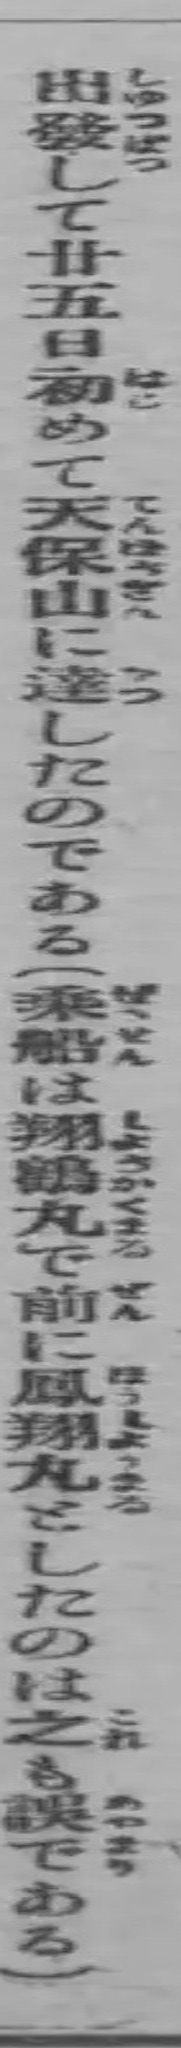出発して廿五日初めて天保山に達したのである(乗船は翔鶴丸で前に鳳翔丸としたのは之も誤である)
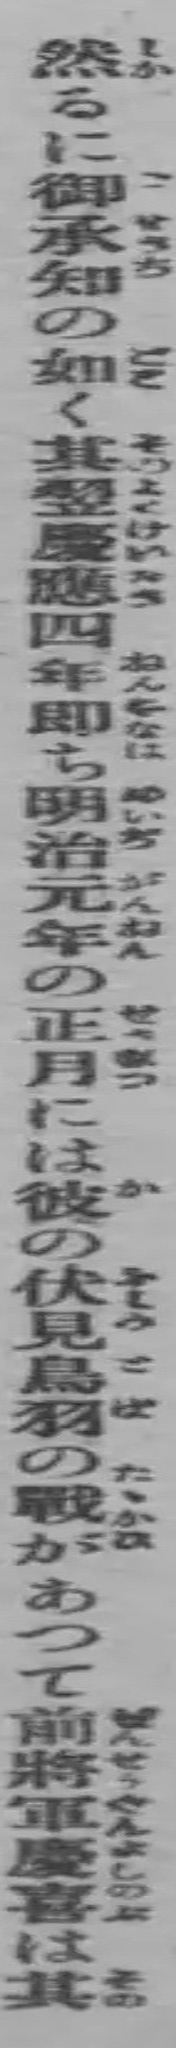然るに御承知の如く其翌慶応四年即ち明治元年の正月には彼の伏見鳥羽の戦があつて前将軍慶喜は其
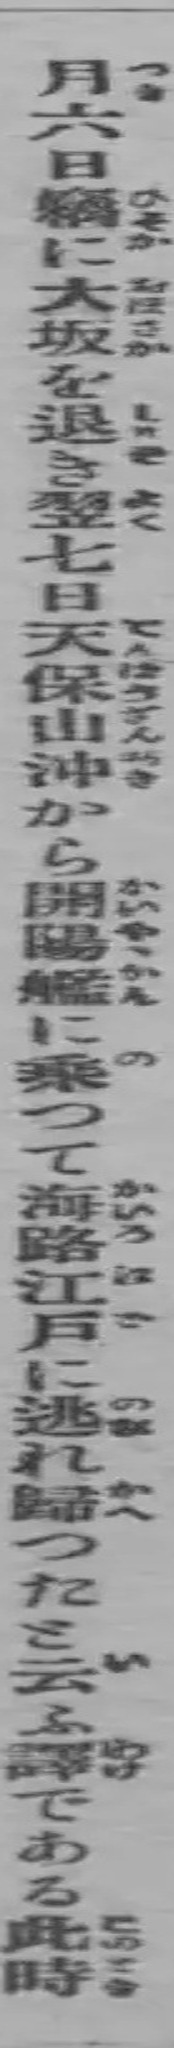月六日竊に大坂を退き翌七日天保山沖から開陽艦に乗つて海路江戸に逃れ帰つたと云ふ訳である此時
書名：豊橋市史談
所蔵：国立国会図書館 National Diet Library, JAPAN
